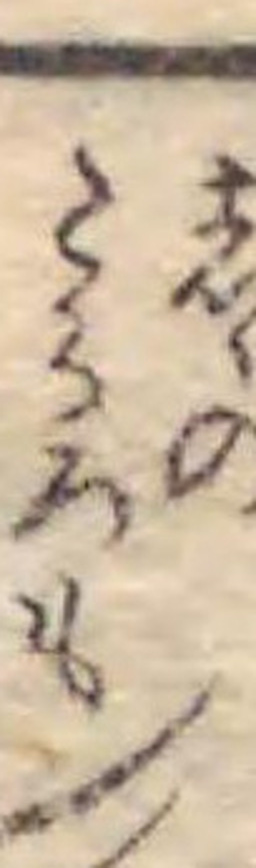こうろも
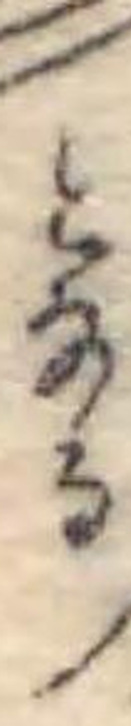となる
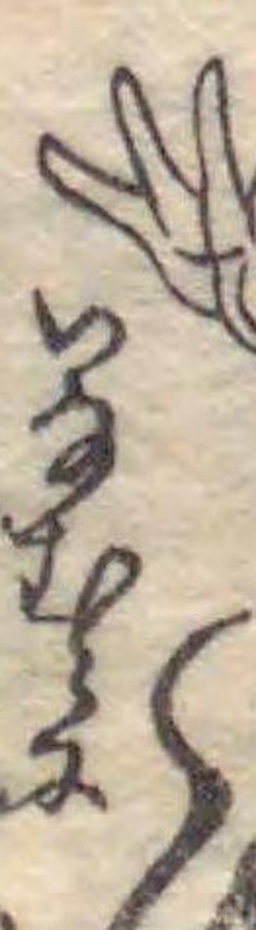いなむらに
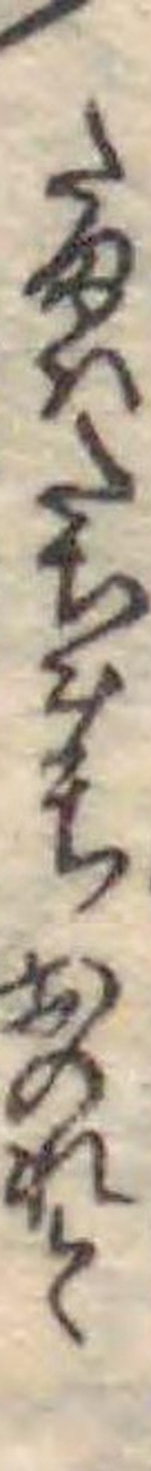たまはたちまちおのれと
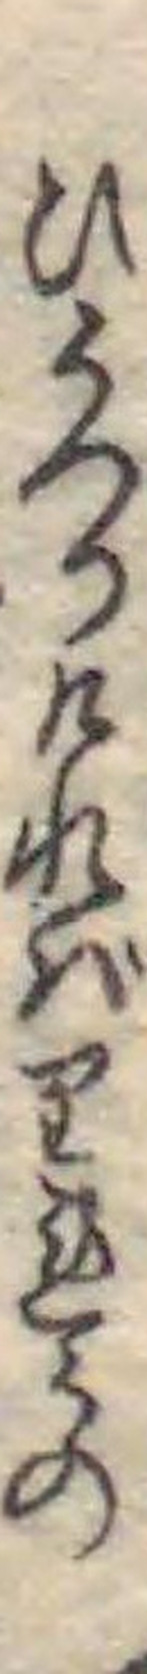ひかうつりければりれうの
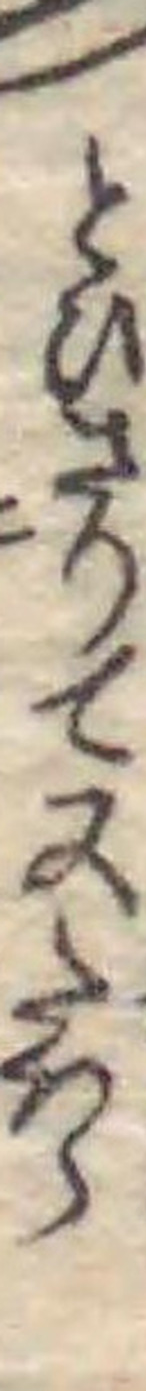とひさりて又たはら
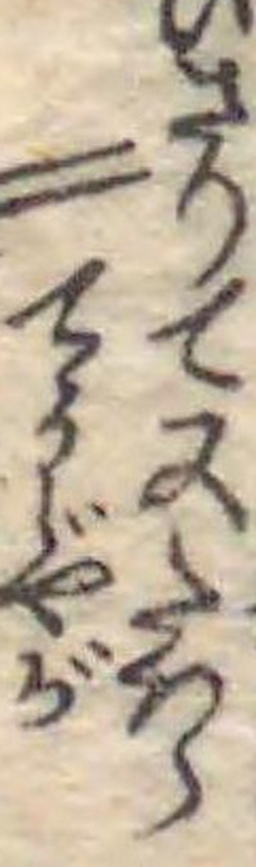てうじやが
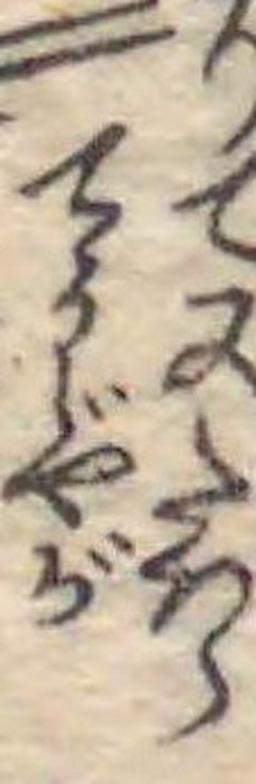てうじやが
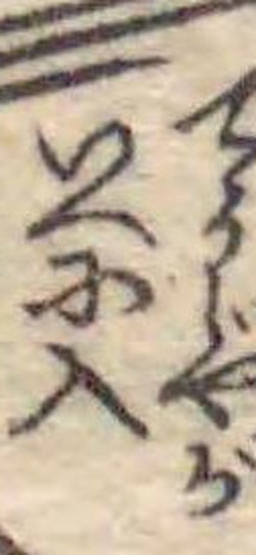いへに入
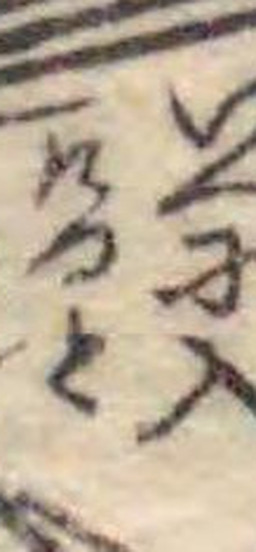けると

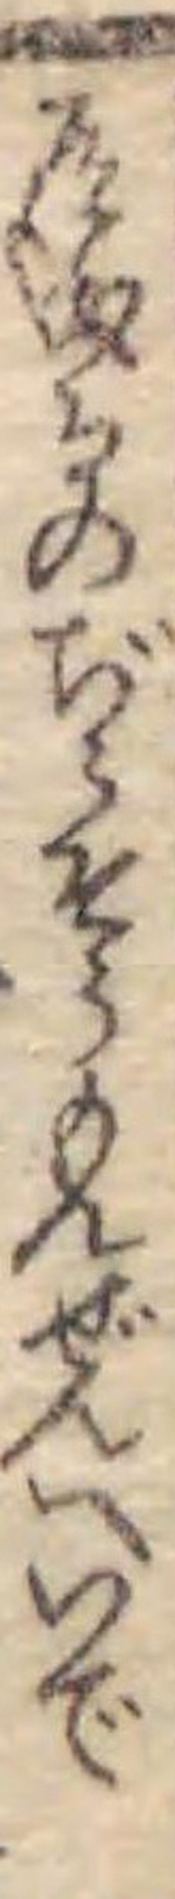道成寺のぢそうもんぜんへいで
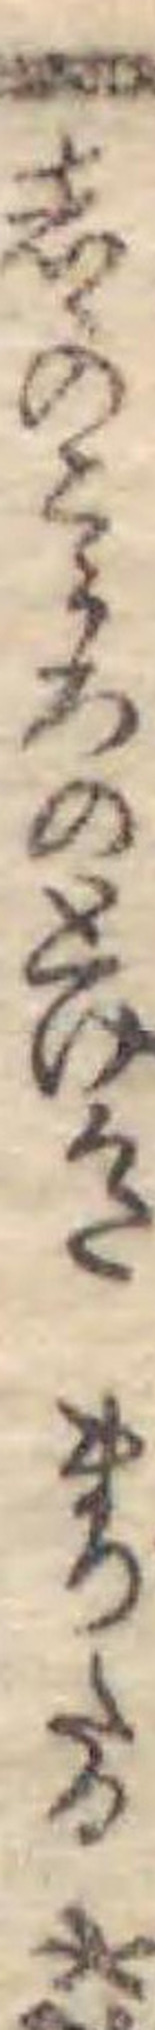しゝのこうろのとけかたまりたる
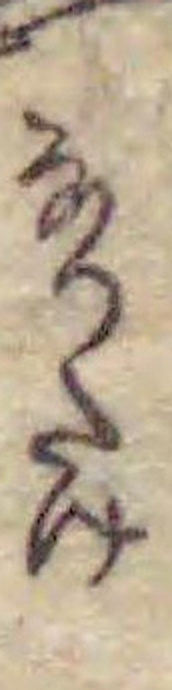なりたけ
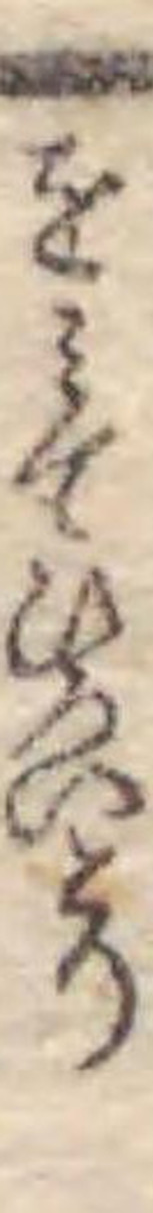をみてひろいとり
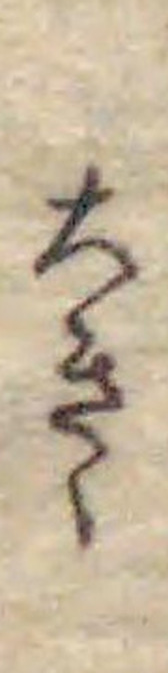大きく
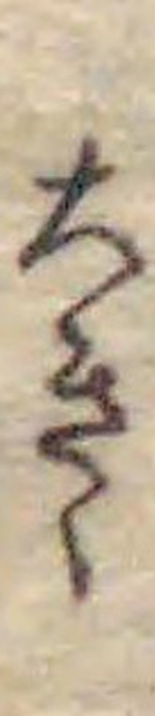大きく
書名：鐘入七人化粧 : 3巻
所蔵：国立国会図書館 National Diet Library, JAPAN
